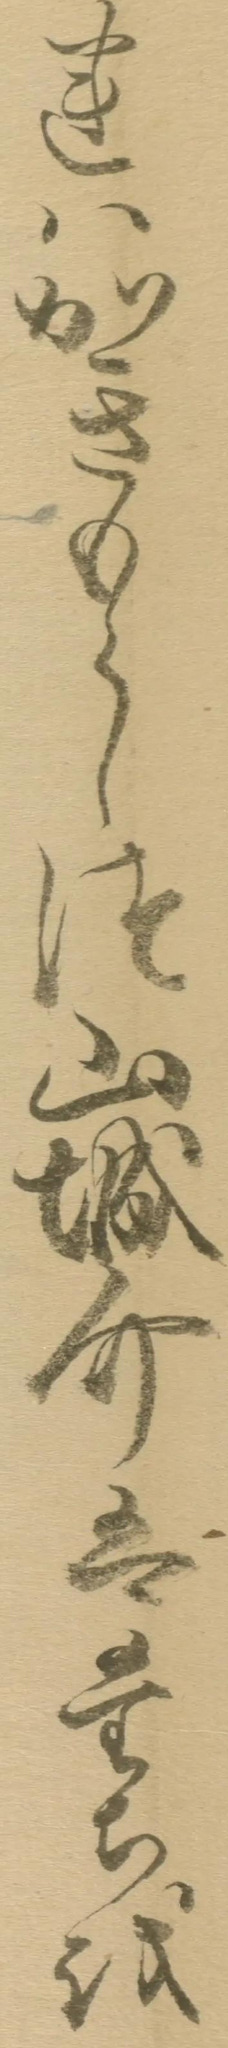れはかきもらしつ山城介はたちを
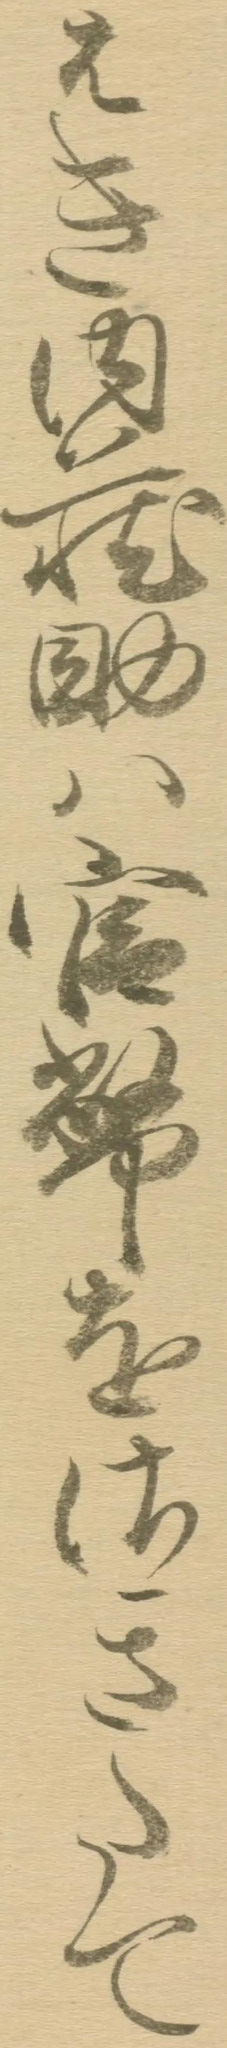はき内蔵助は官幣をさきたて
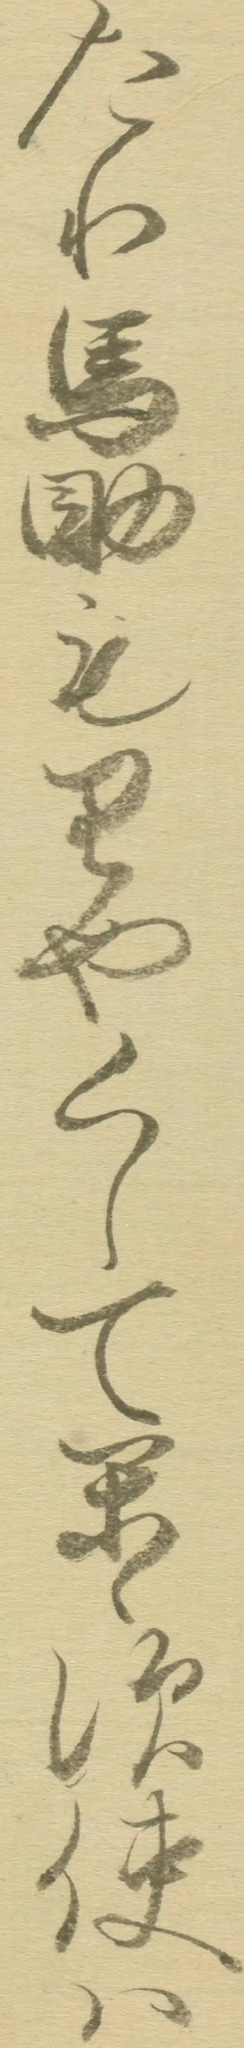たり馬助もりやくしてかゝす使は
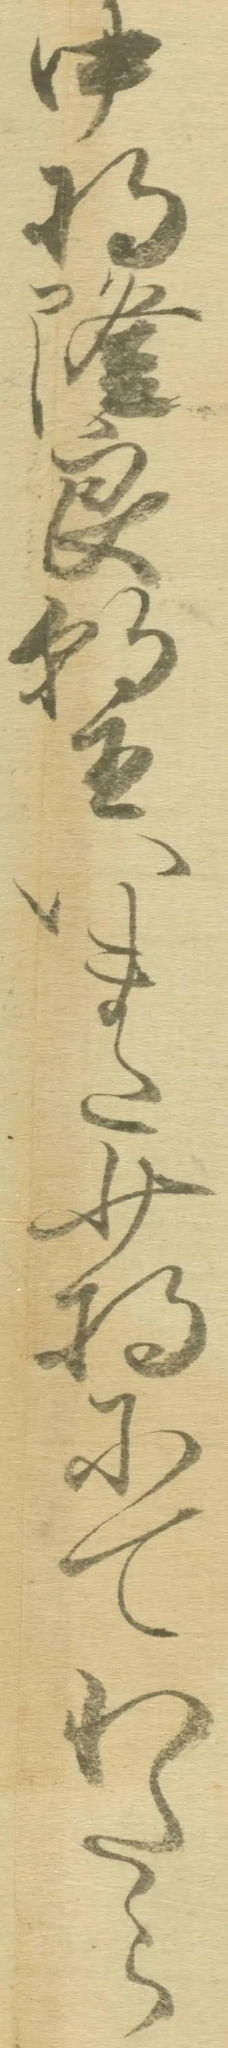中将隆良朝臣いまた少将にてわたら
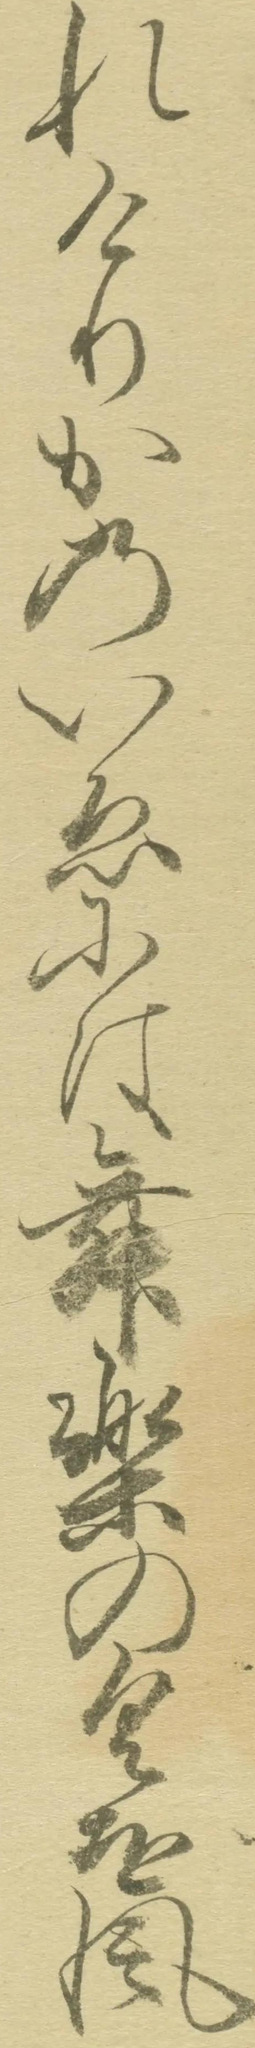れけりかのいゑには舞楽の具を風
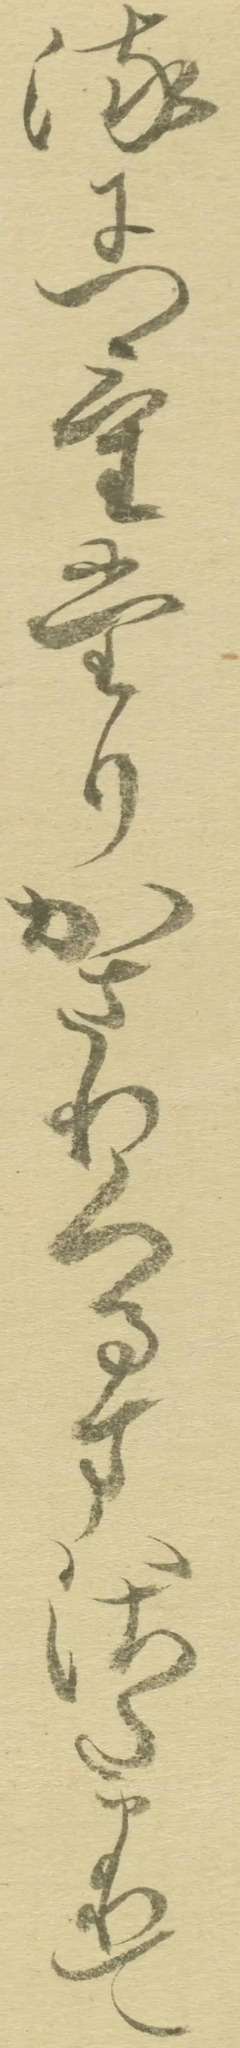流につけたりかさりくるまはさたまりて
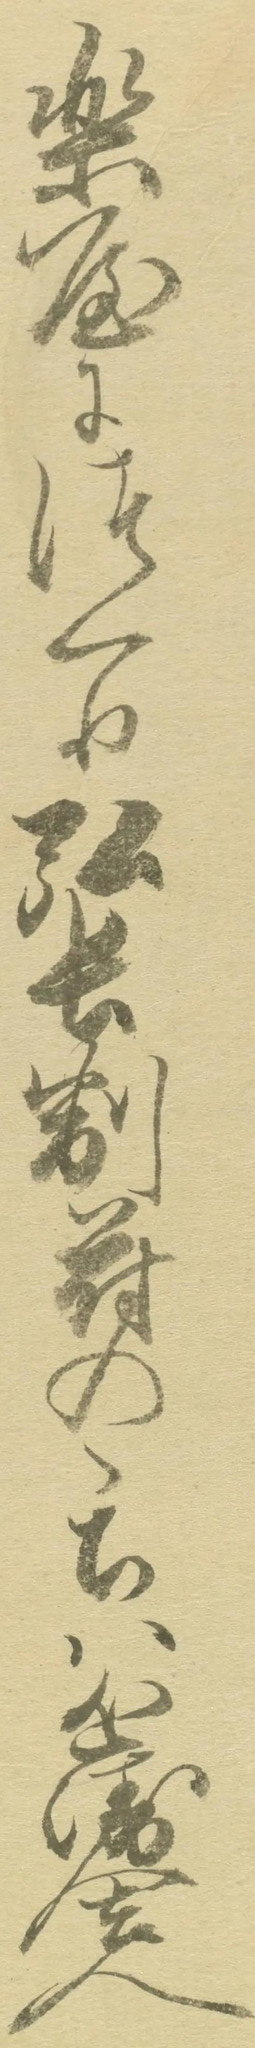楽屋につくり弘長制符のゝちは兵衛舎人
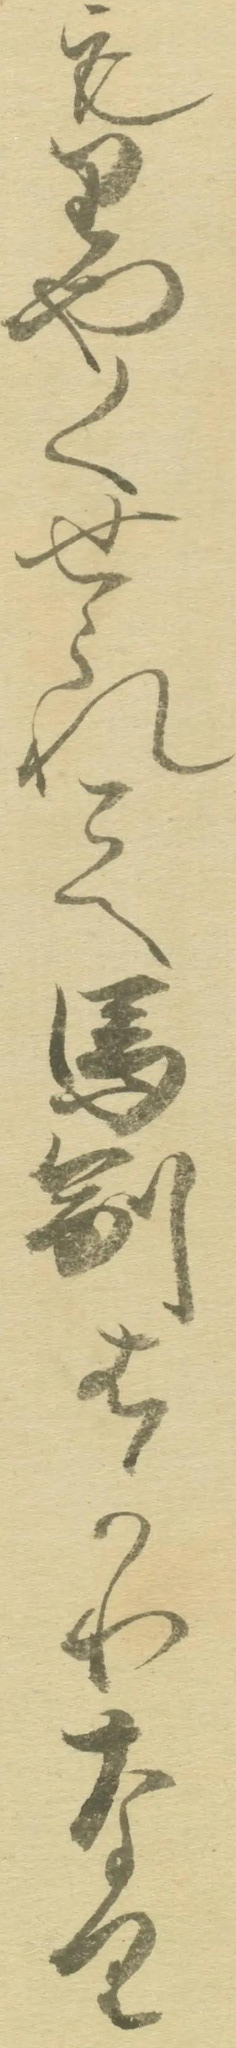もりやくせられて馬副はかりなり
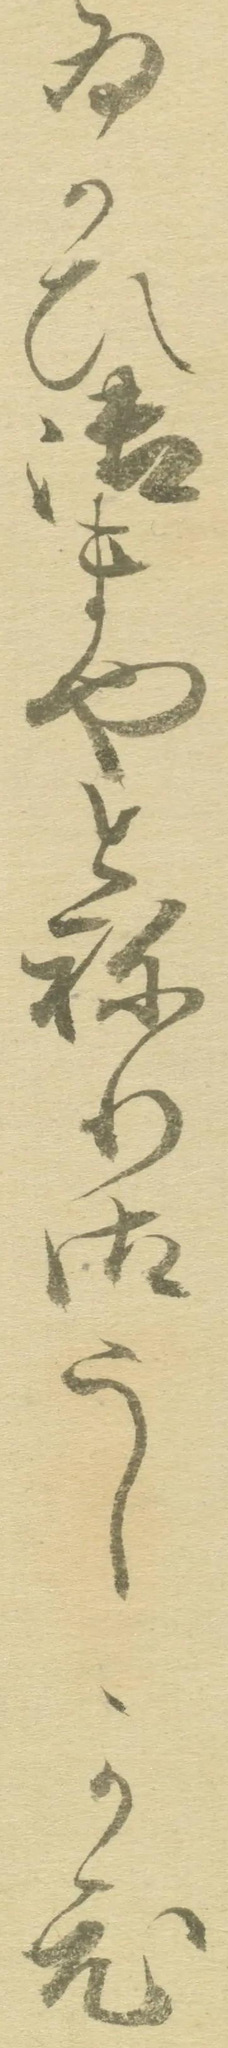ゐかひ御まやとねり御うしかひ
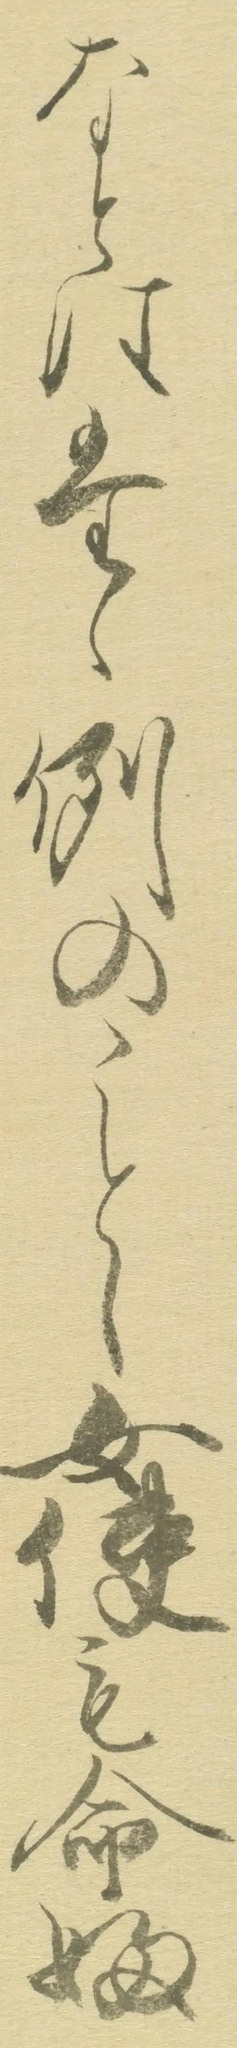なとはたゝ例のことし女使も命婦
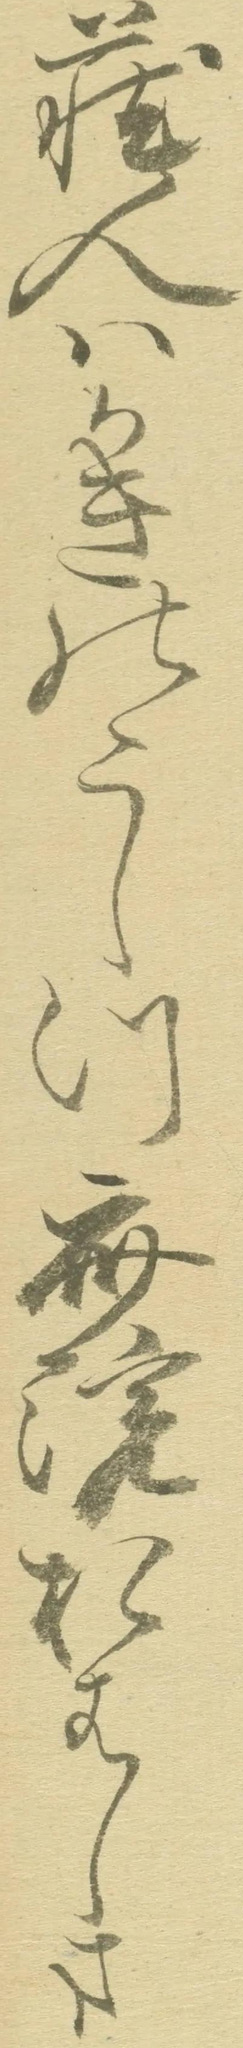蔵人はかきのこしつ斎院おはしま
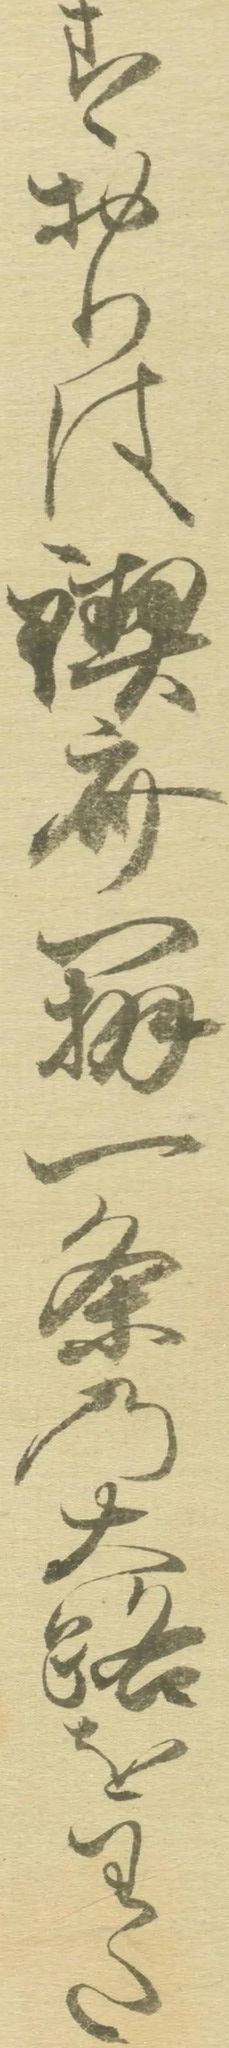すおりは禊斎弁一条の大路をわた
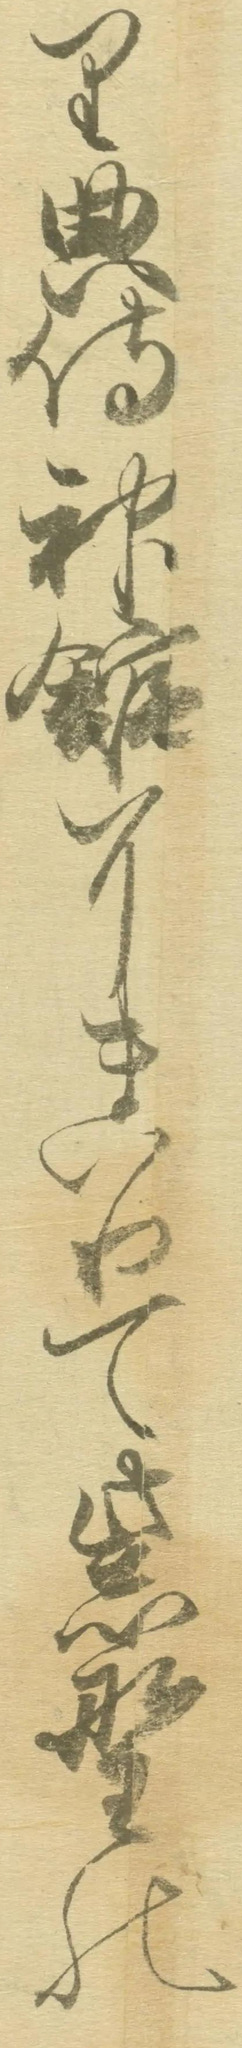り典侍神館にまいりて紫野の
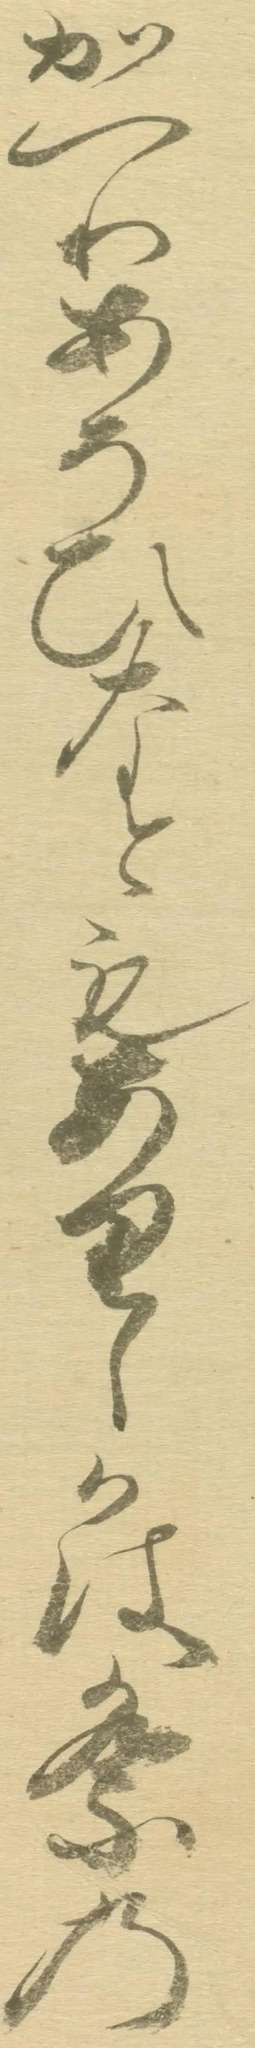かへりあそひなともありしかは祭の
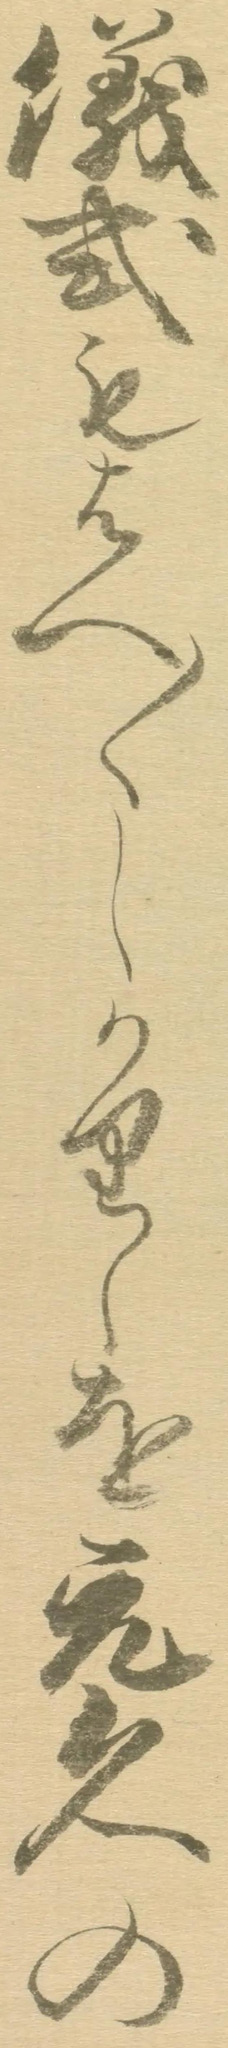儀式もはへ〳〵しかりしを元久の
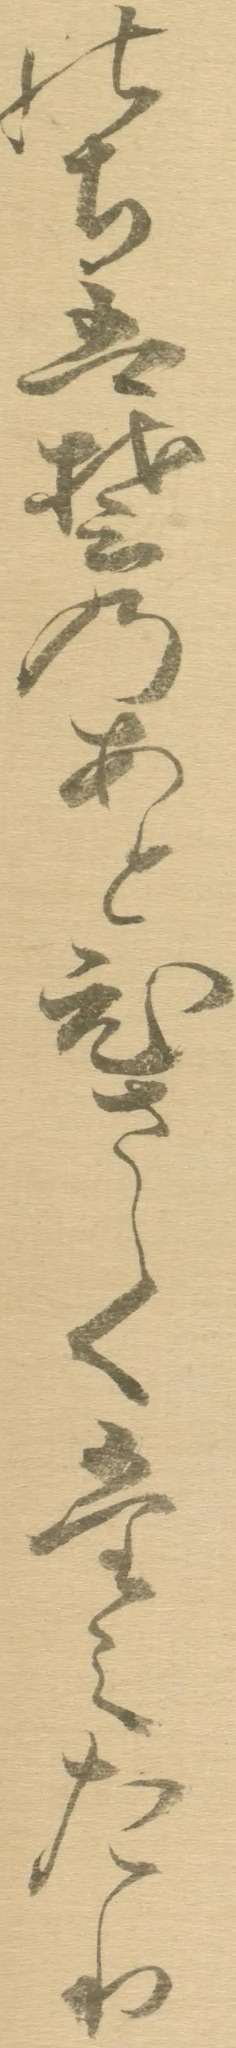のちはそのあとひさしくたえたり
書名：賀茂祭縁起
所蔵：国立国会図書館 National Diet Library, JAPAN
